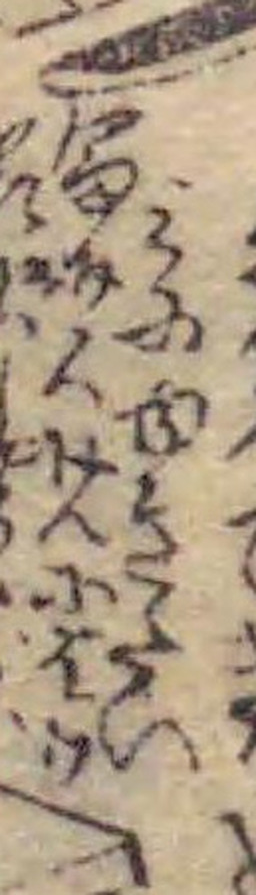富介人けんにはけ
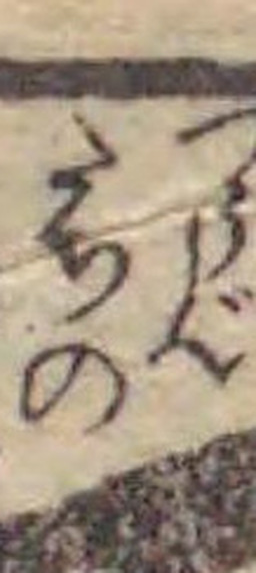たちの
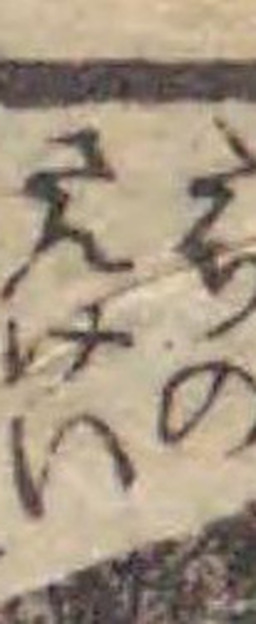さんけい
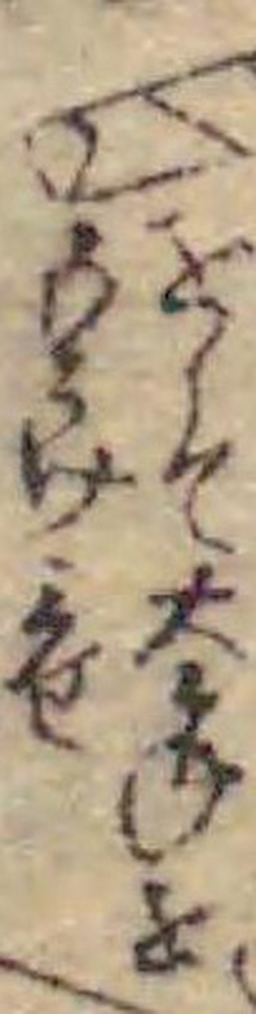もうけみせ
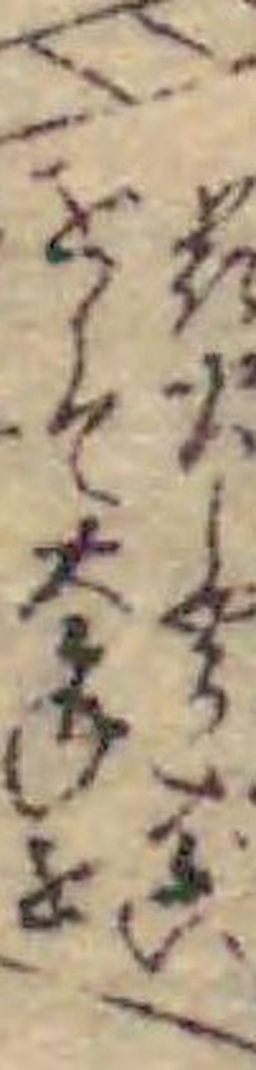をして大かねを
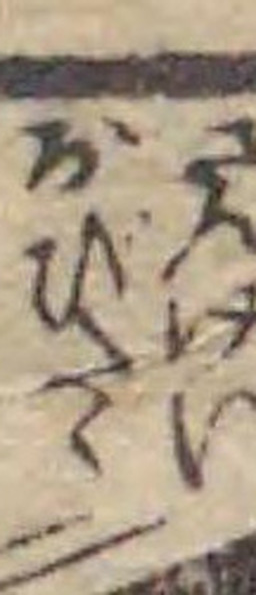おびたゝ

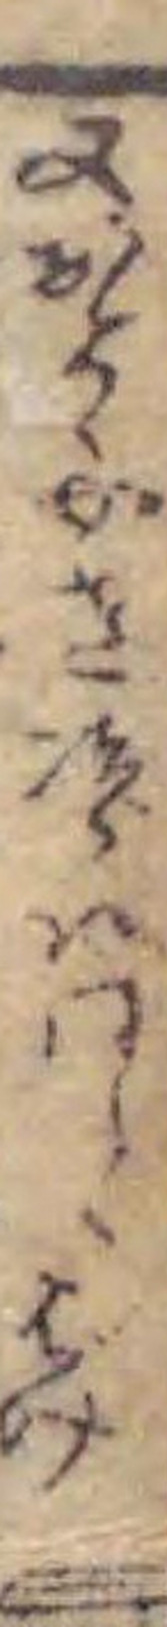又おとゝかき次郎は同じくばけ
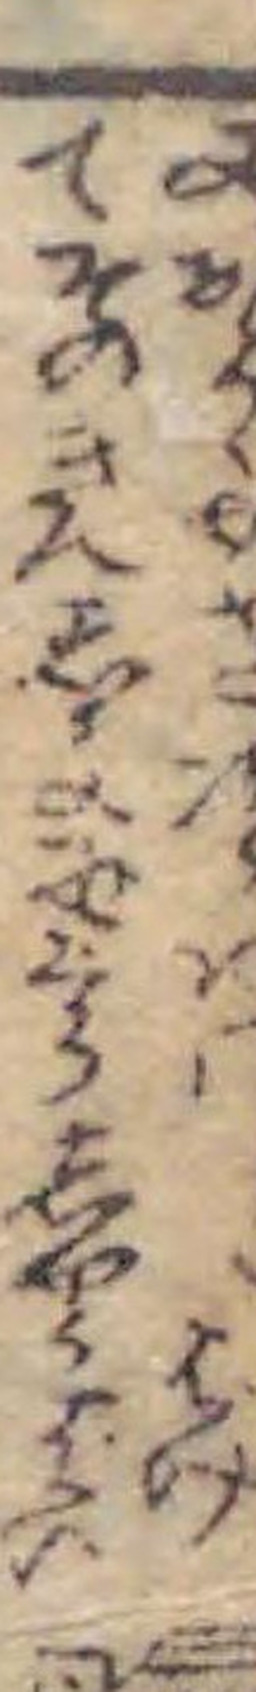てそのきんしよにしやうばい
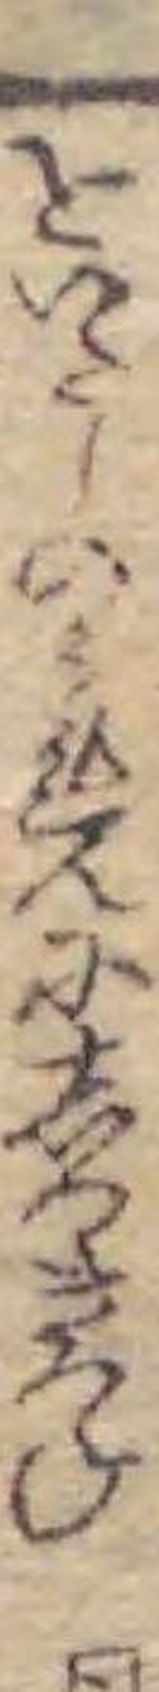をいたしのうれんにしろきつね
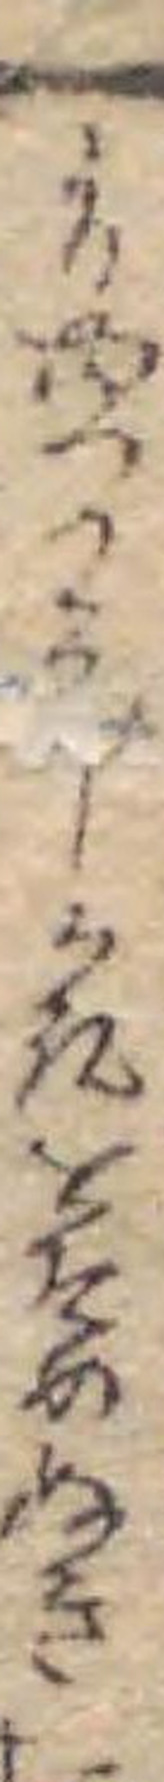よりゆつりうけしかきをそめぬき
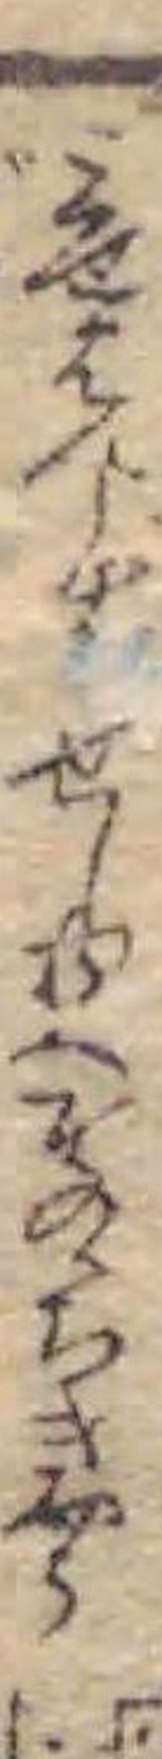みせはんしやうせしゆへそのゝちきやう
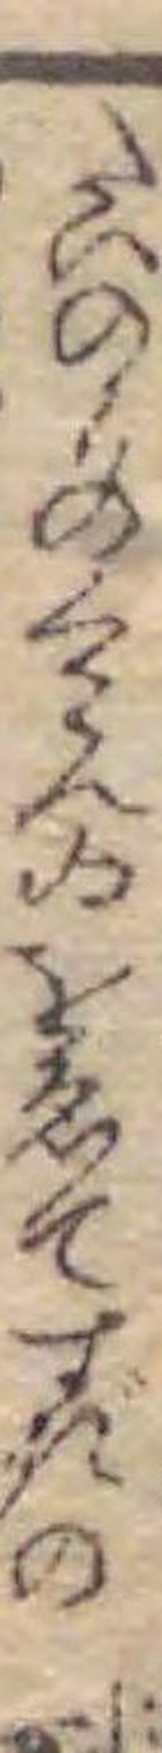だいのものくわんゐをゑてすぎの
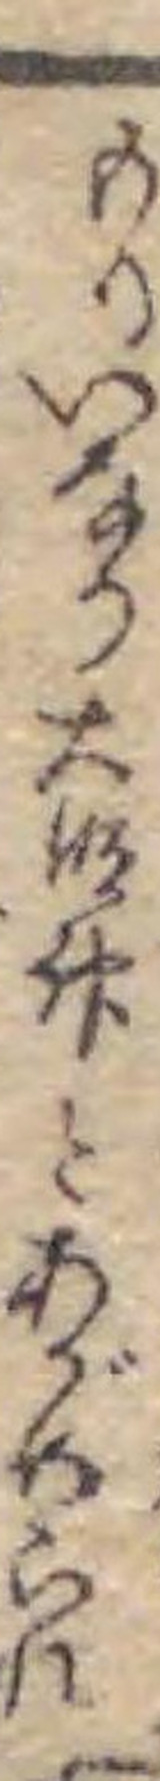もりいなり大明神とあがめられ
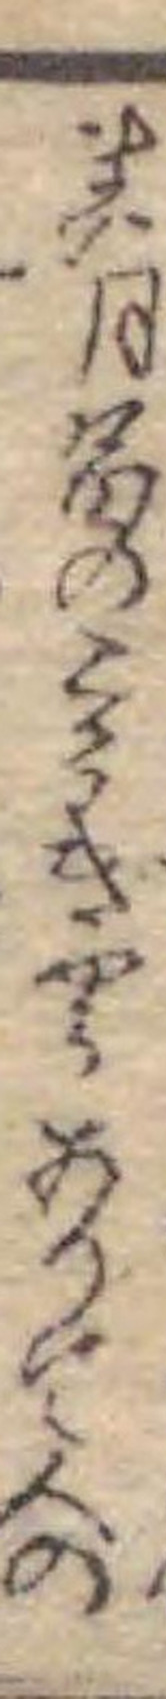まい月富のこうぎやうありて人の
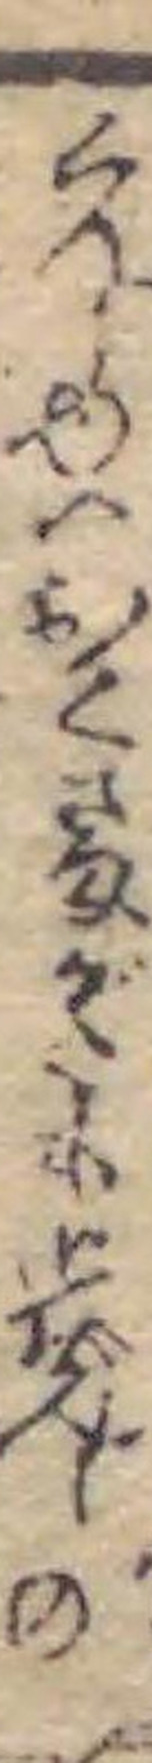くんしゆはおこさまがた御ぞんしの
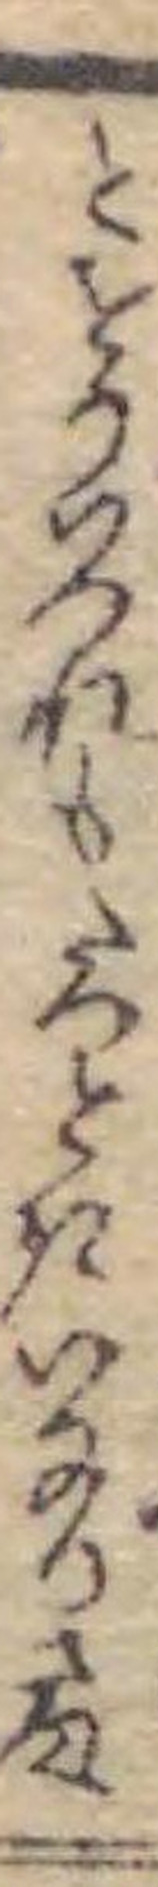とをりいつれもたつときいなりさま
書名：扨化狐通人 : 2巻
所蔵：国立国会図書館 National Diet Library, JAPAN
